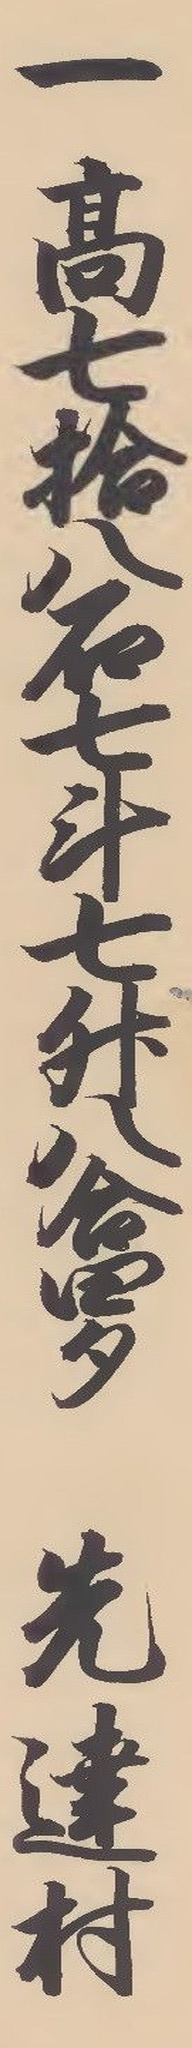一高七拾八石七斗七升八合四勺先達村
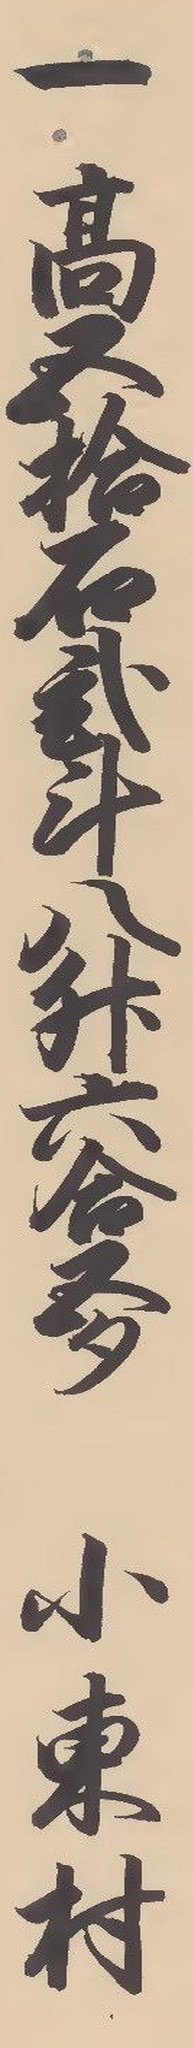一高五拾石弐斗八升六合五勺小東村
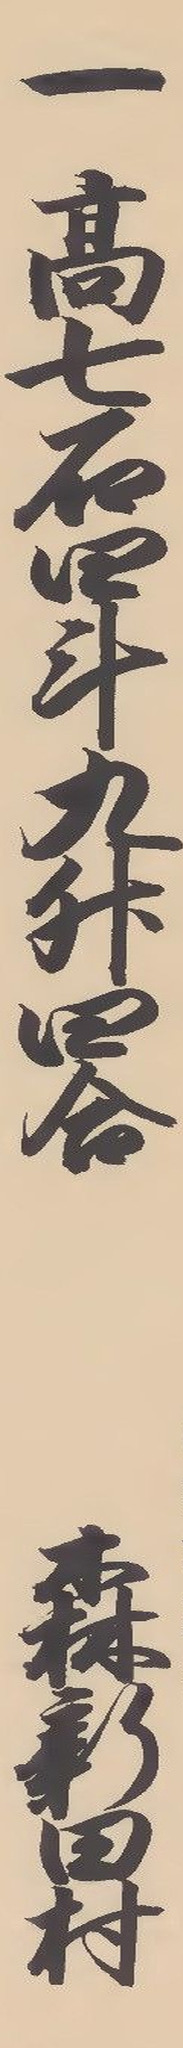一高七石四斗九升四合森新田村
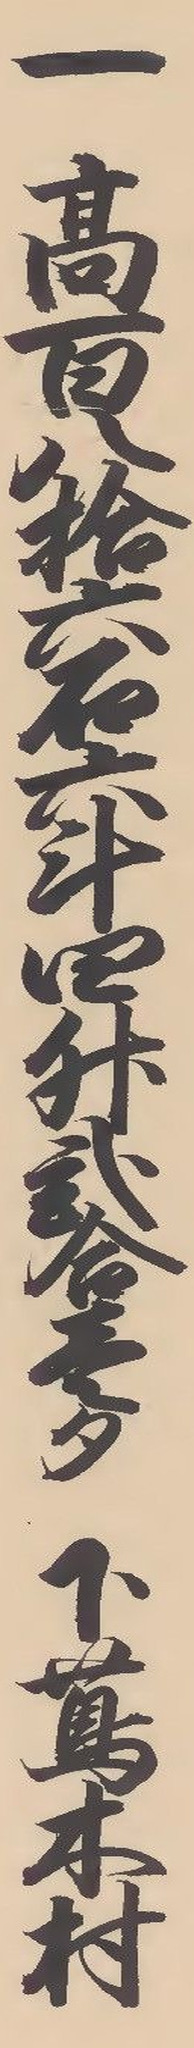一高百八拾六石六斗四升弐合壱勺下蔦木村
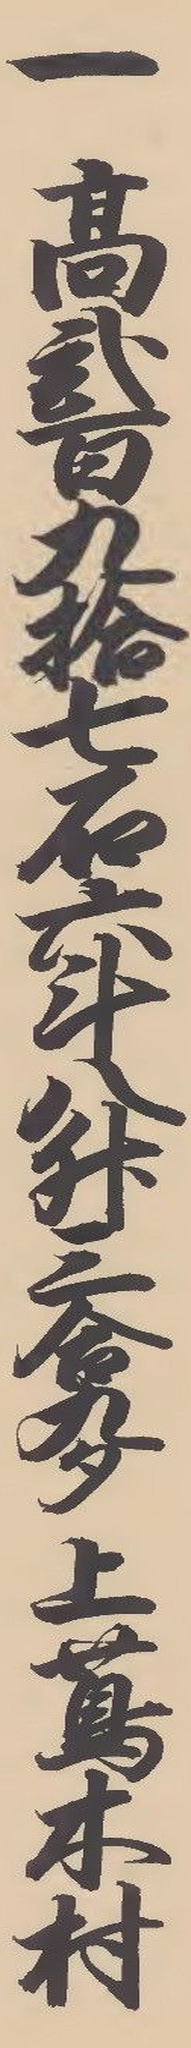一高弐百九拾七石六斗八升三合九勺上蔦木村
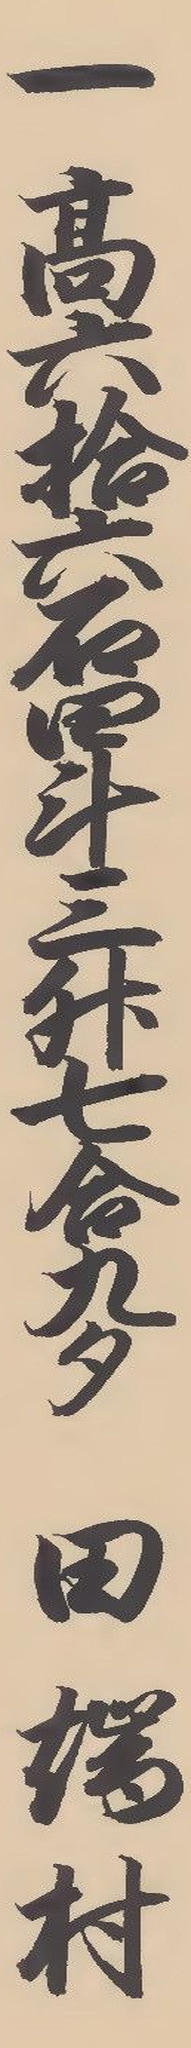一高六拾六石四斗三升七合九勺田端村
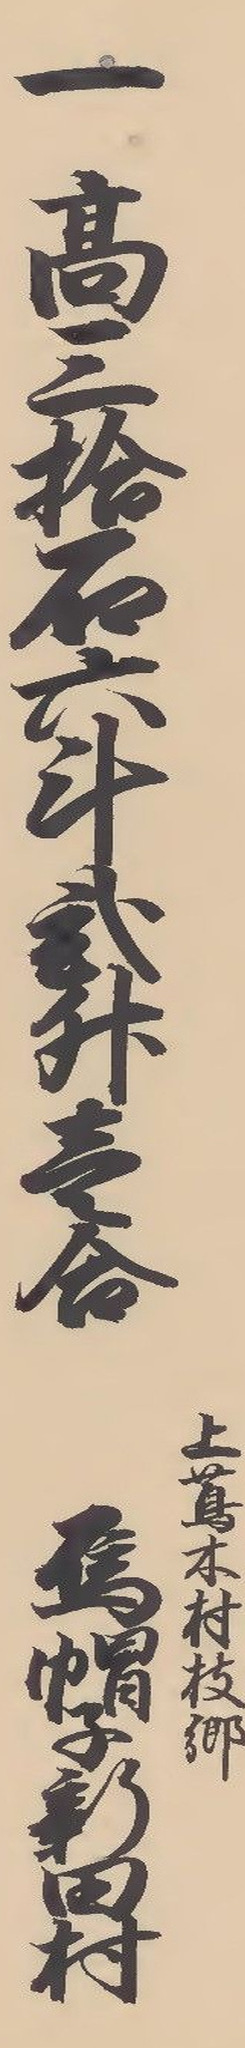一高三拾石六斗弐升壱合烏帽子新田村
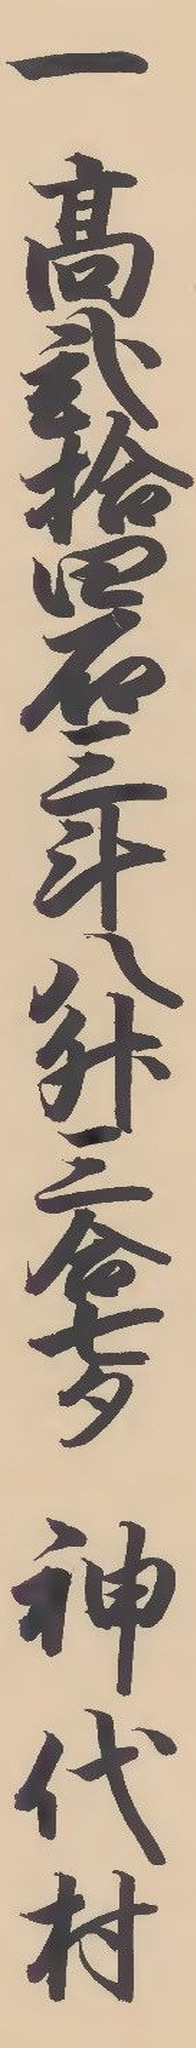一高弐拾四石三斗八升三合七勺神代村

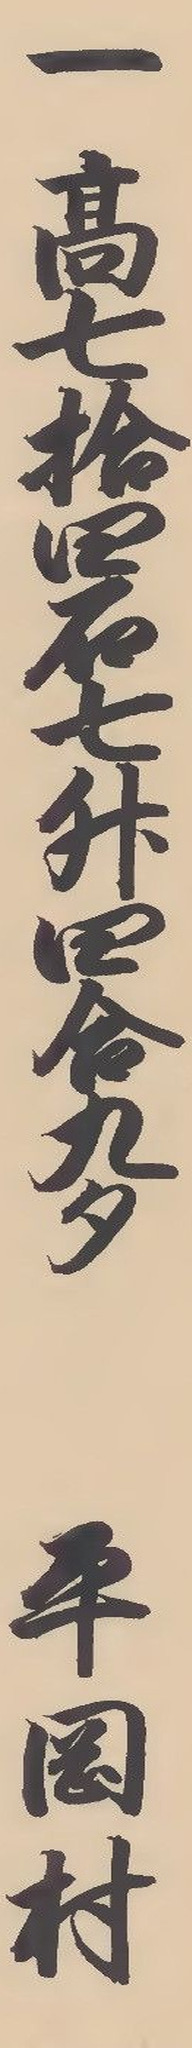一高七拾四石七升四合九勺平岡村
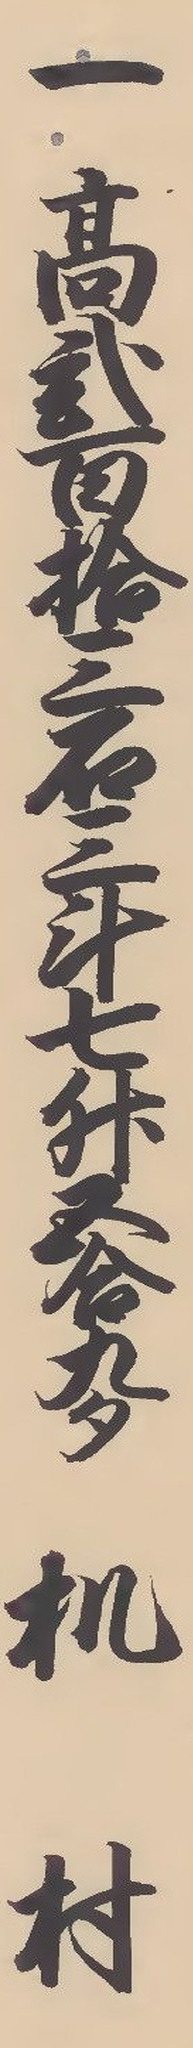一高弐百拾三石三斗七升五合九勺机村
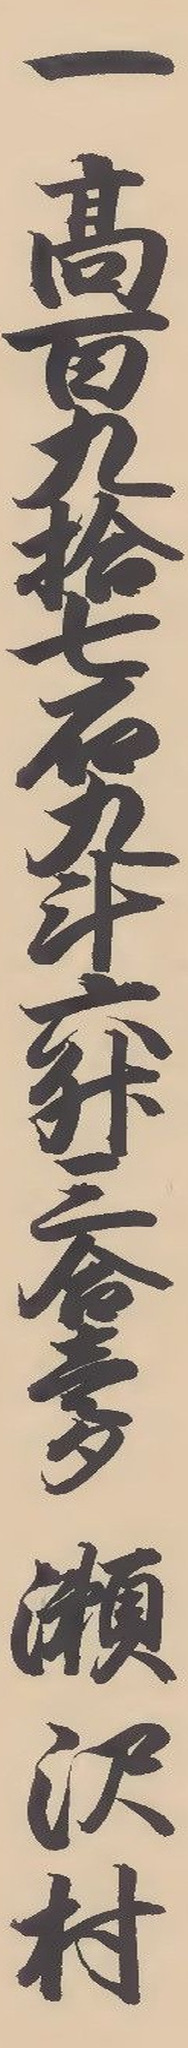一高百九拾七石九斗六升三合壱勺瀬沢村
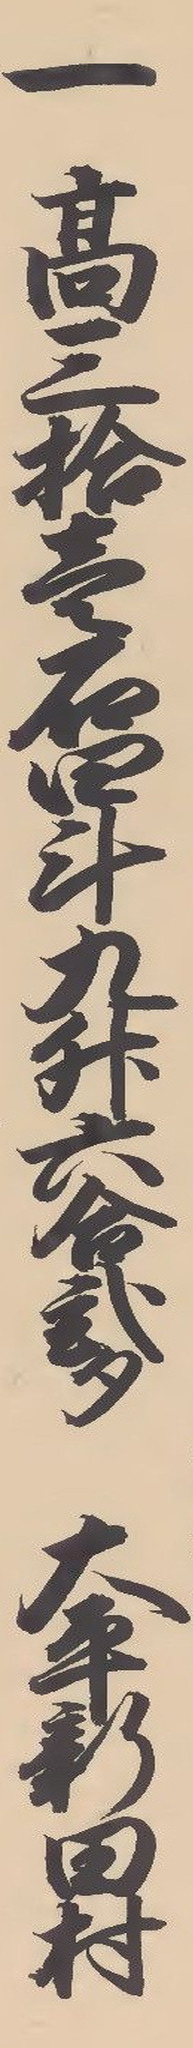一高三拾壱石四斗九升六合弐勺大平新田村
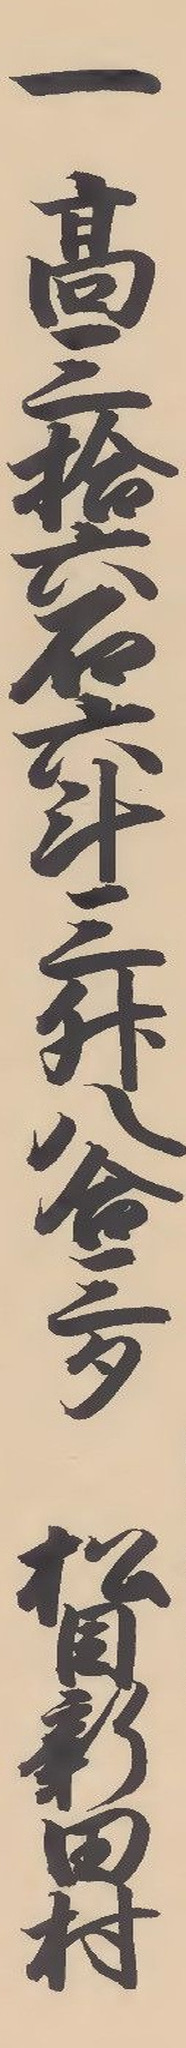一高三拾六石六斗三升八合三勺松目新田村
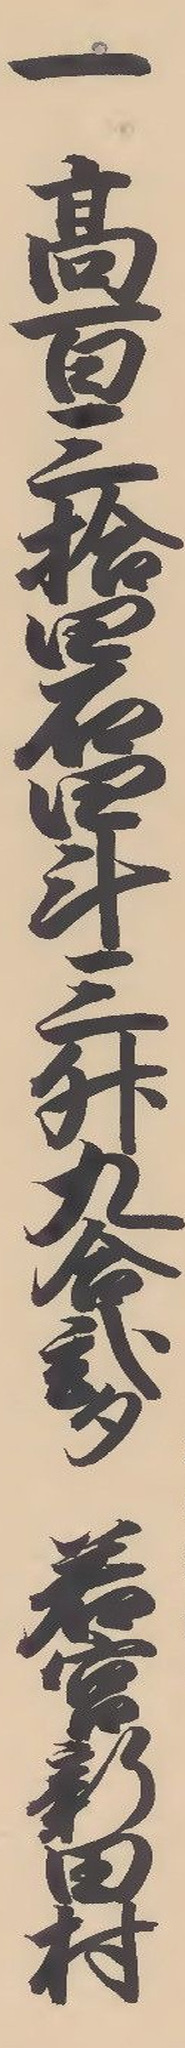一高百三拾四石四斗三升九合弐勺若宮新田村
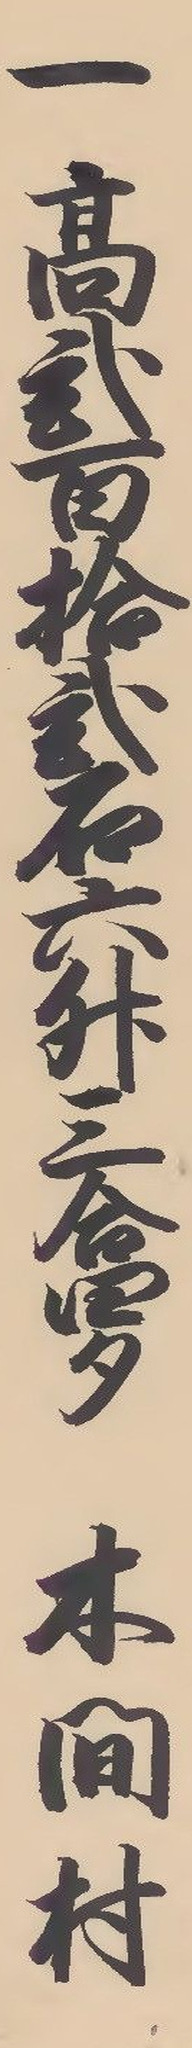一高弐百拾弐石六升三合四勺木間村

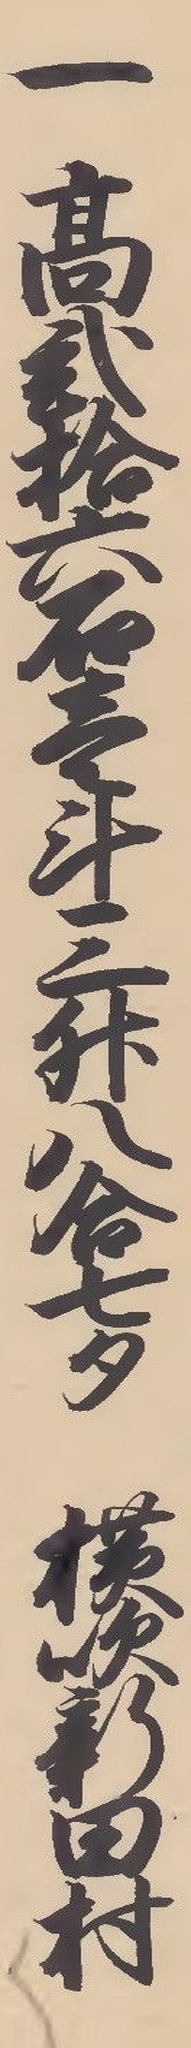一高弐拾六石壱斗三升八合七勺横吹新田村
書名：信濃国郷帳
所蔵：国立公文書館 National Archives of Japan
